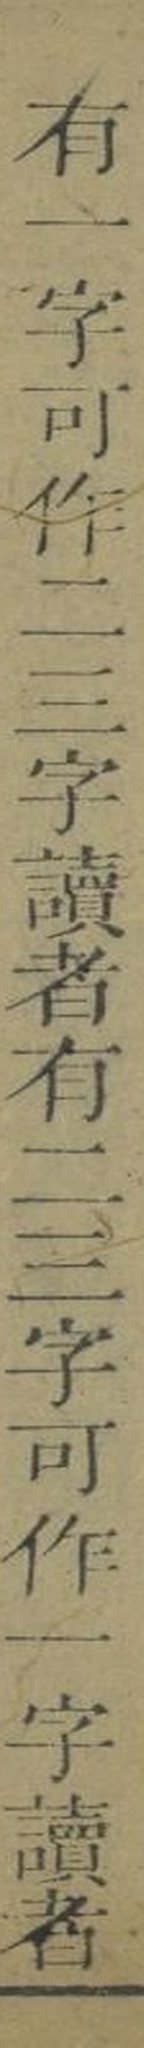有一字可作二三字読者有二三字可作一字読者
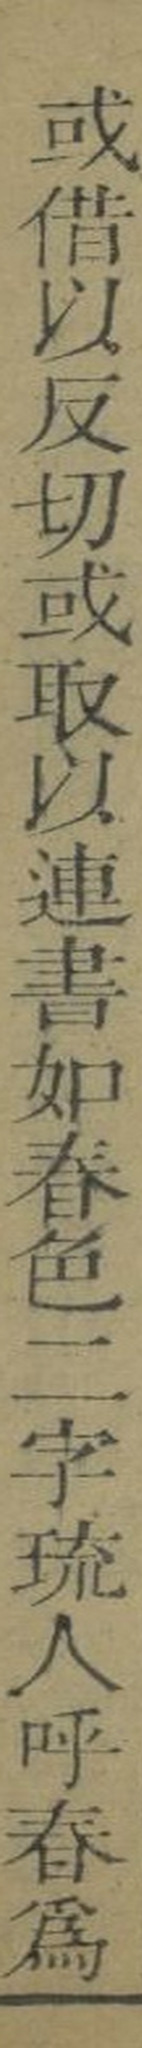或借以反切或取以連書如春色二字琉人呼春為
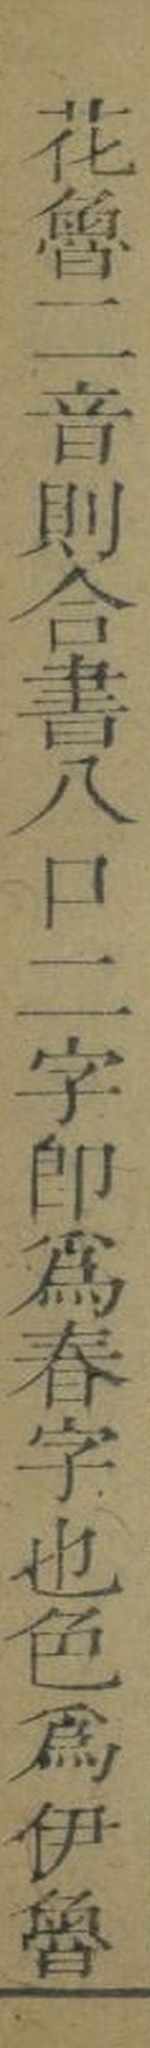花魯二音則合書八口二字即為春字也色為伊魯

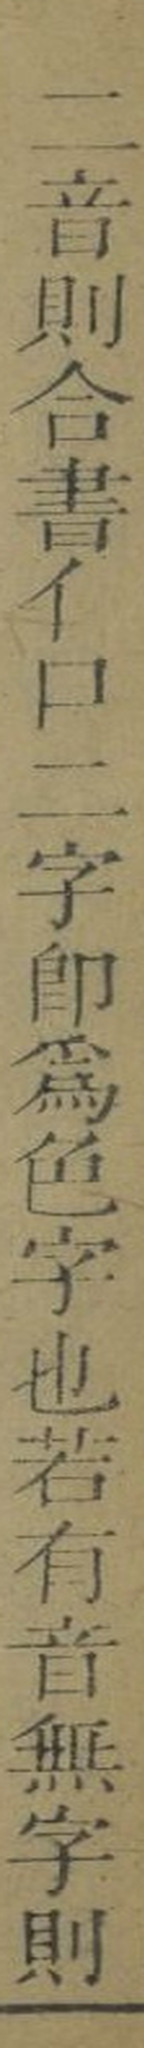二音則合書イロ二字即為色字也若有音無字則
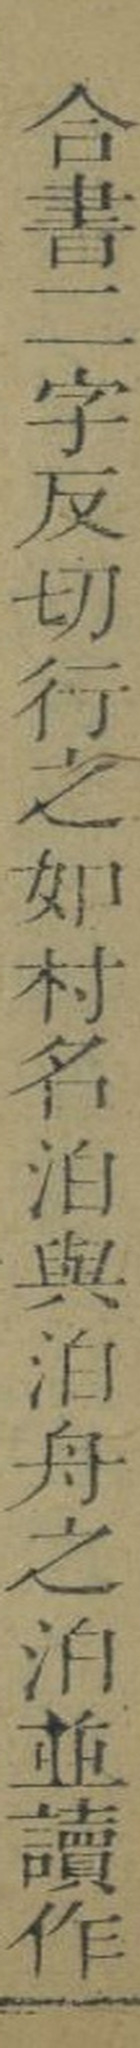合書二字反切行之如村名泊与泊舟之泊並読作
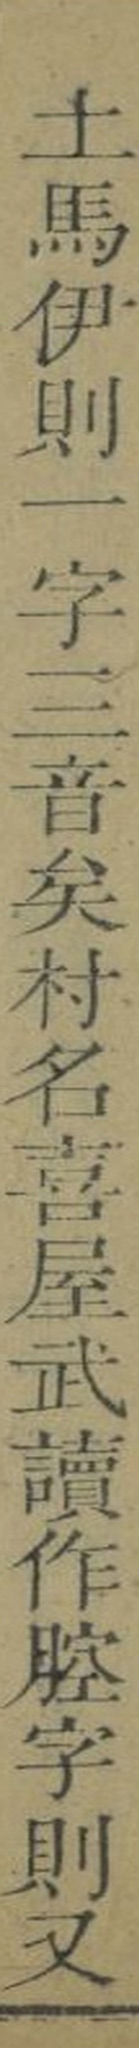土馬伊則一字三音矣村名喜屋武読作腔字則又
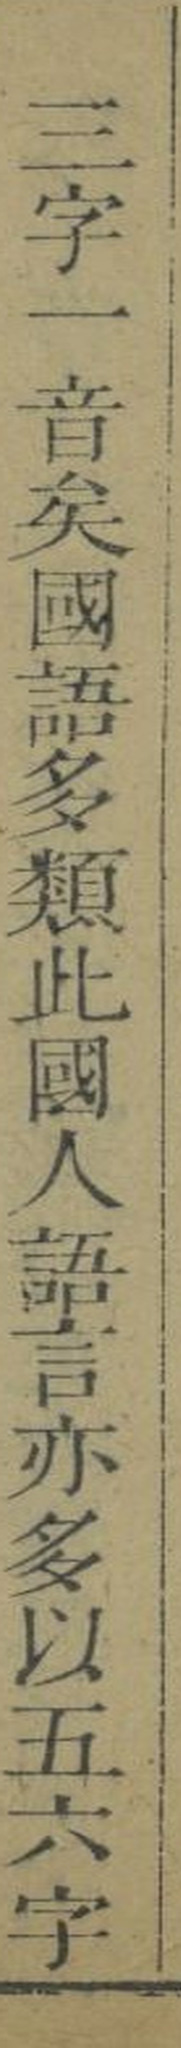三字一音矣国語多類此国人語言亦多以五六字
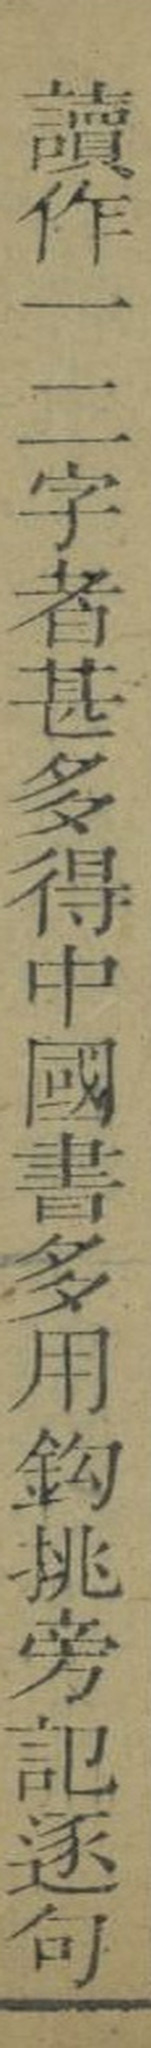読作一二字者甚多得中国書多用鈎挑旁記逐句
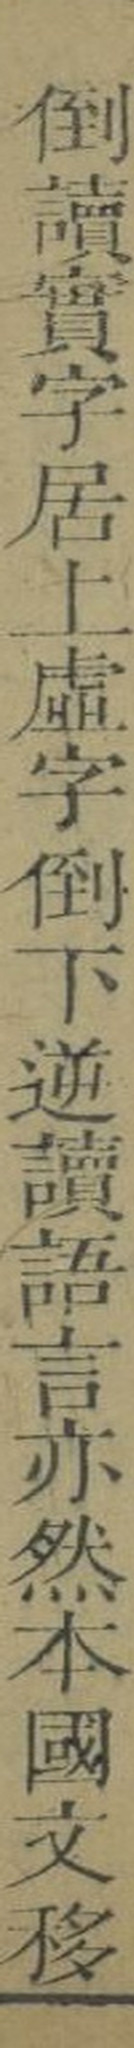倒読実字居上虚字倒下逆読語言亦然本国文移
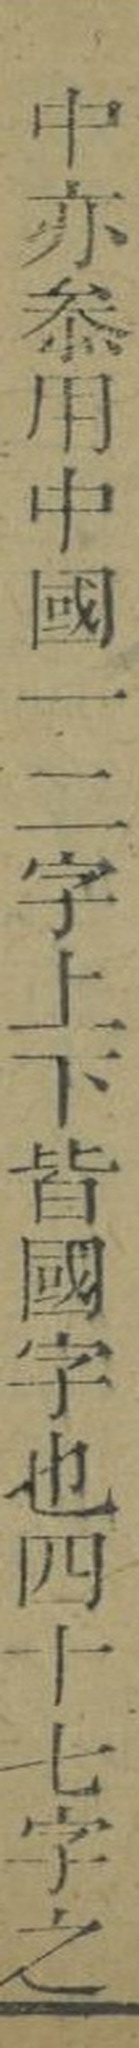中亦参用中国一二字上下皆国字也四十七字之
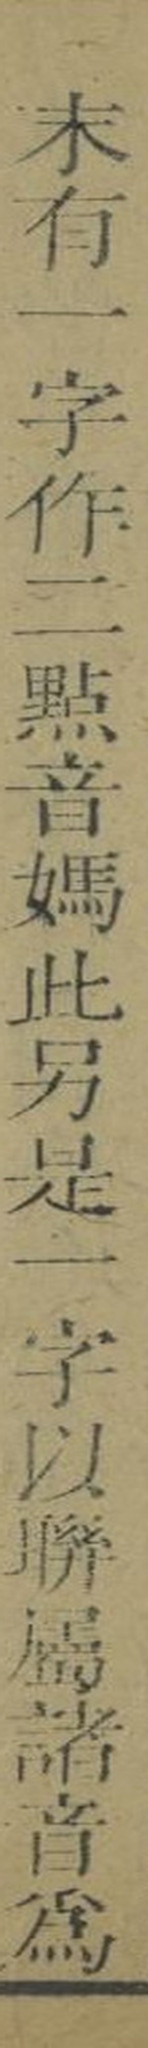末有一字作二点音媽此另是一字以聯属諸音為
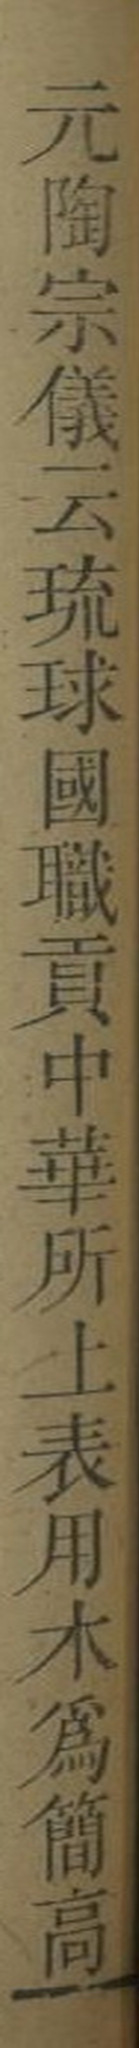元陶宗儀云琉球国職貢中華所上表用木為簡高
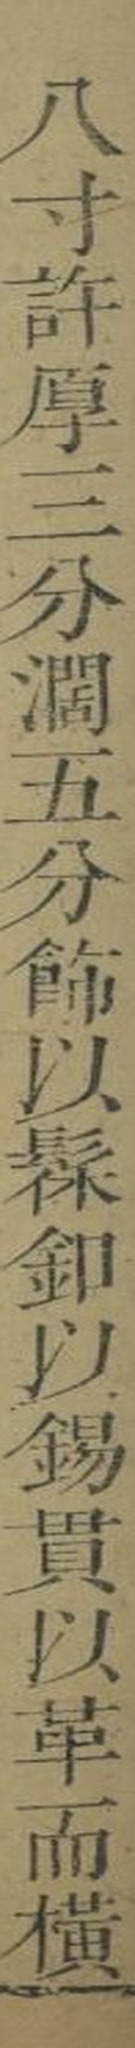八寸許厚三分濶五分飾以髹釦以錫貫以革而横
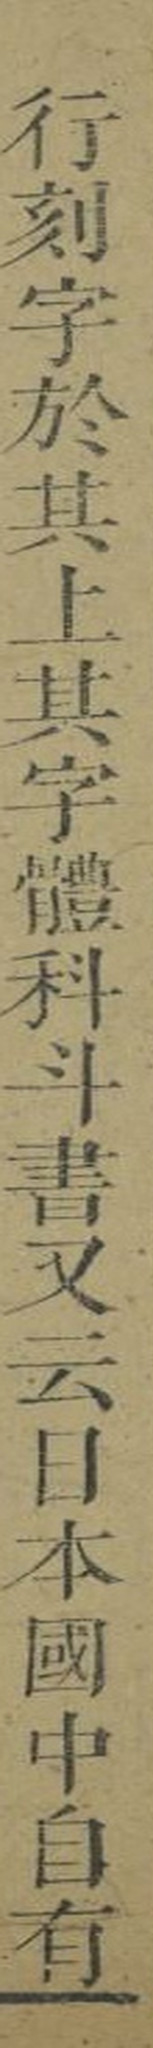行刻字於其上其字体科斗書又云日本国中自有
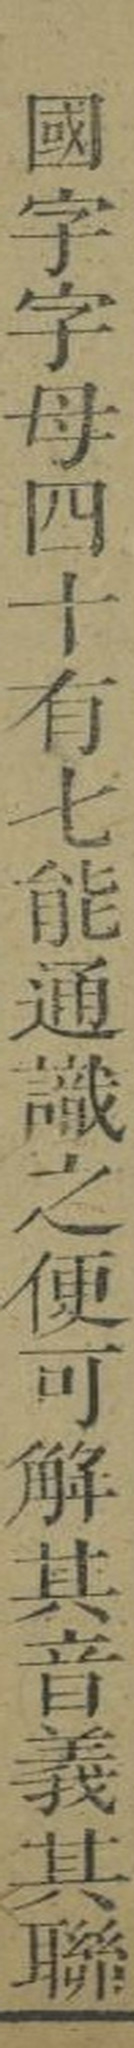国字字母四十有七能通識之便可解其音義其聯
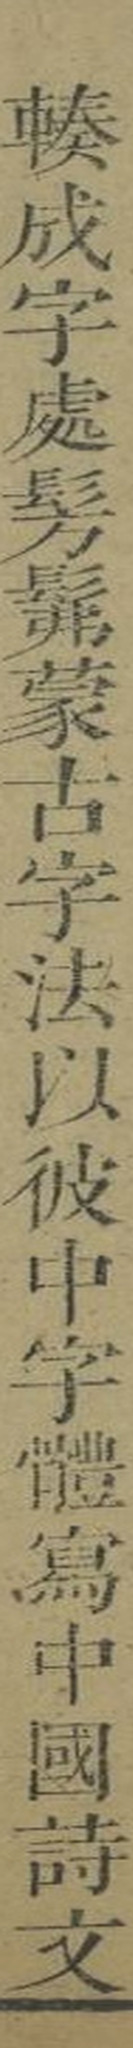輳成字処髣髴蒙古字法以彼中字体写中国詩文
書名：中山伝信録 巻六
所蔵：University of the Ryukyus Library
